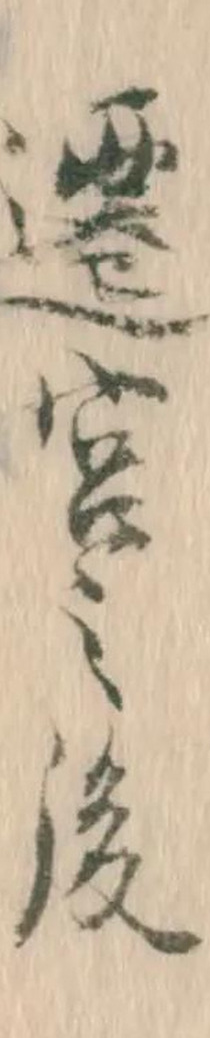遷宮之後
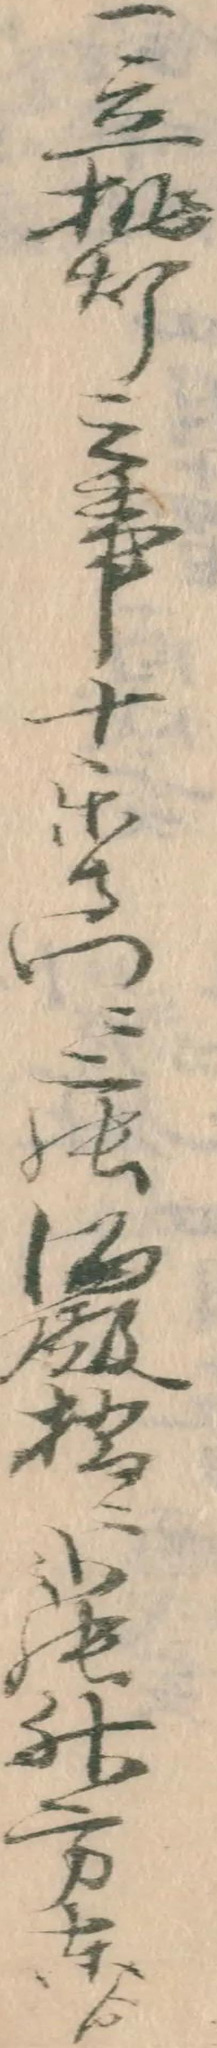一立挑灯之事十楽寺門に二張酒殿橋に弐張升方東より
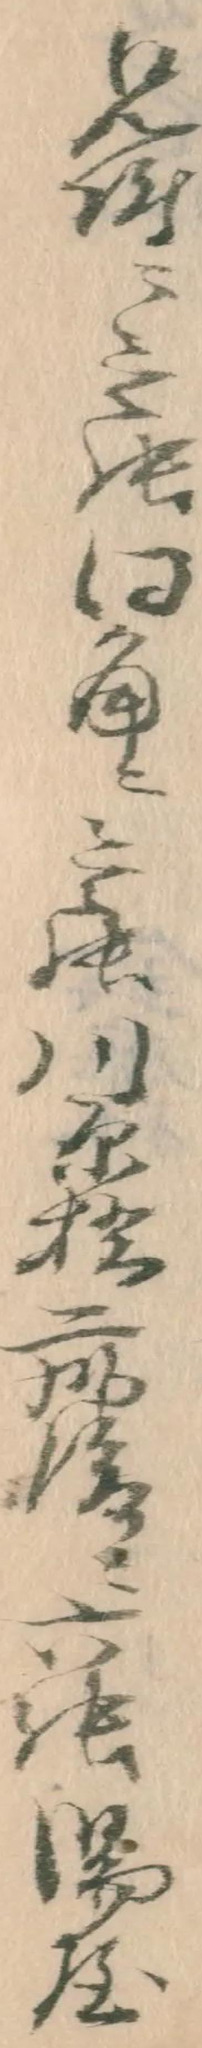見附ニ壱張同角ニ壱張川原橋前後に六張湯屋
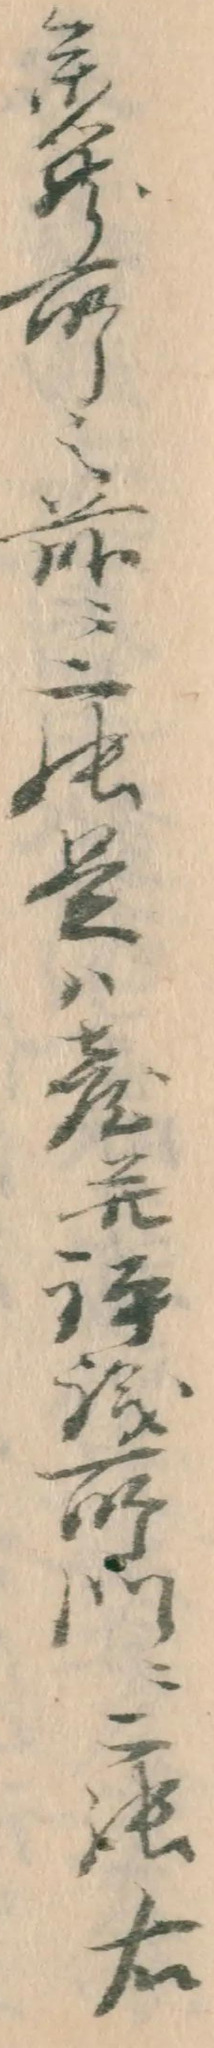参篭所之前ニ二張是ハ臺并評議所門ニ二張右
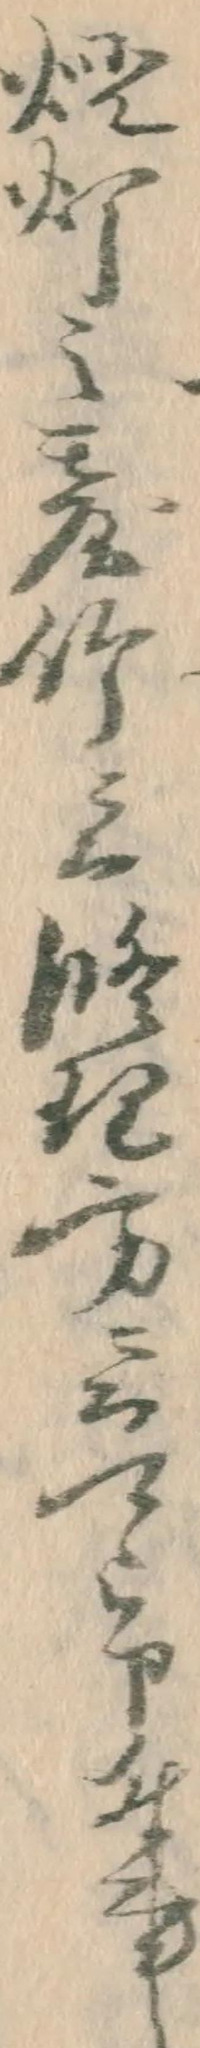燈灯之臺竹ニ而修理方ニ而可被申付事
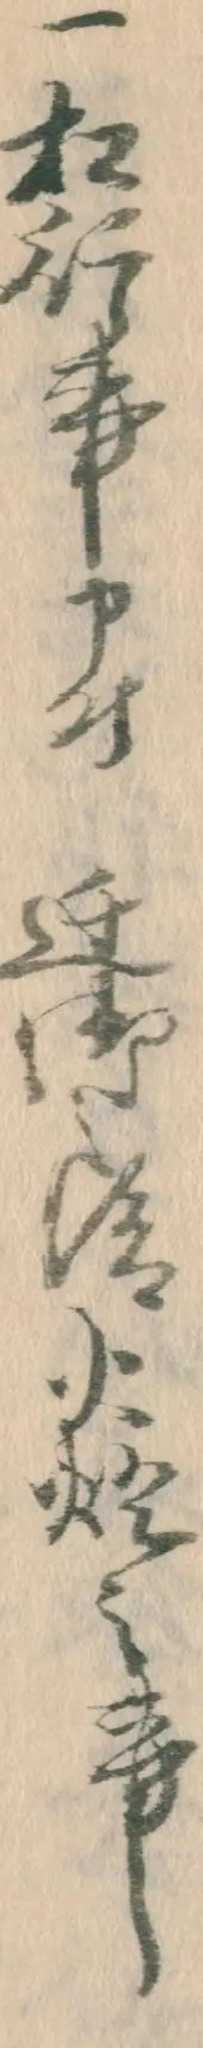一松行事申付遷御之後火燈之事
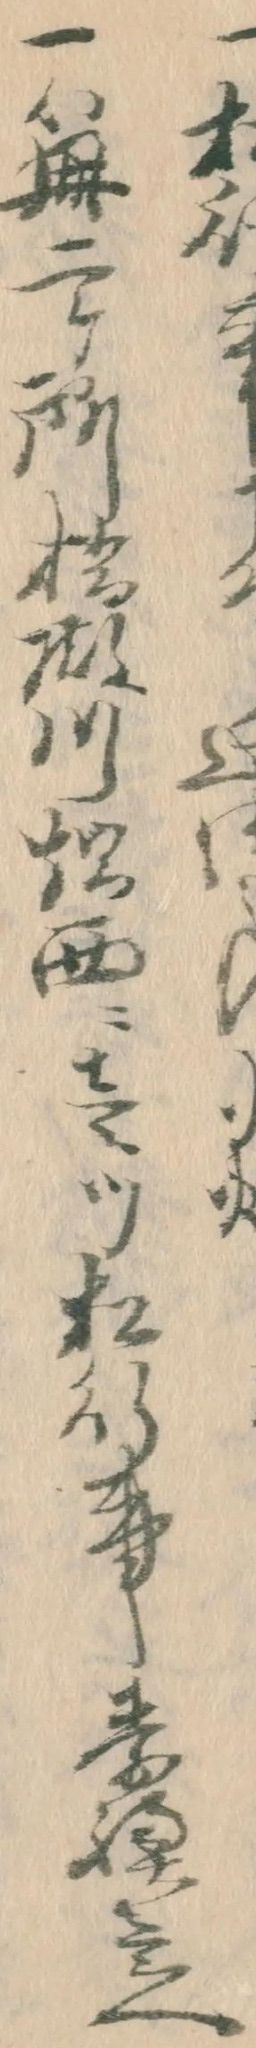一笧二ケ所橋殿川端西ニ壱ツ松行事素襖壱人
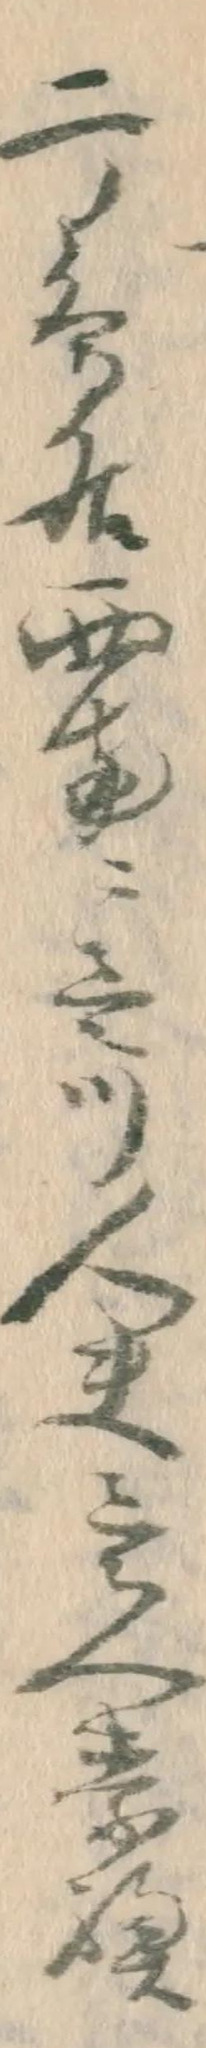二ノ鳥居西南に壱ツ人夫壱人素襖
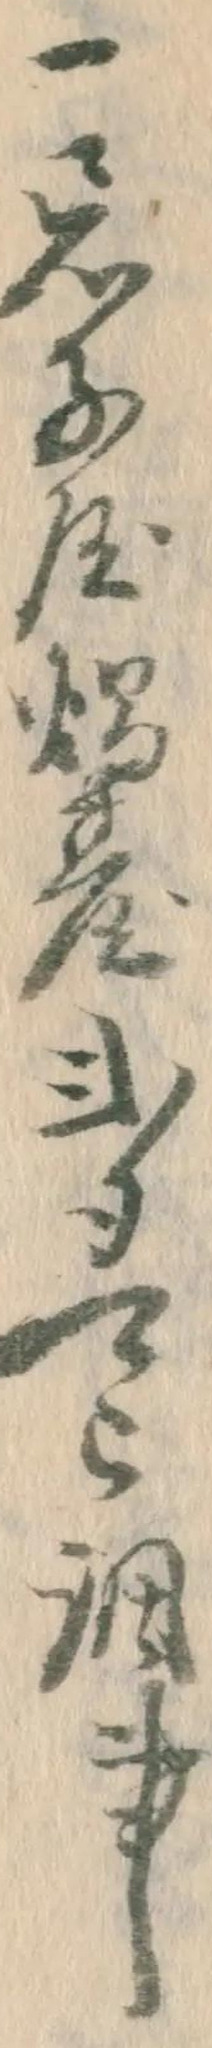一忌子屋燭臺弐ツ可被調事
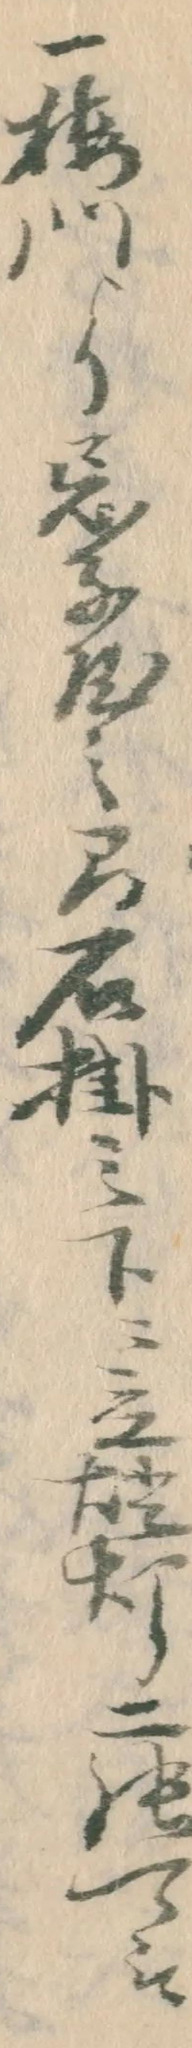一楼門より忌子屋之間石掛之下ニ立燈灯二張可被
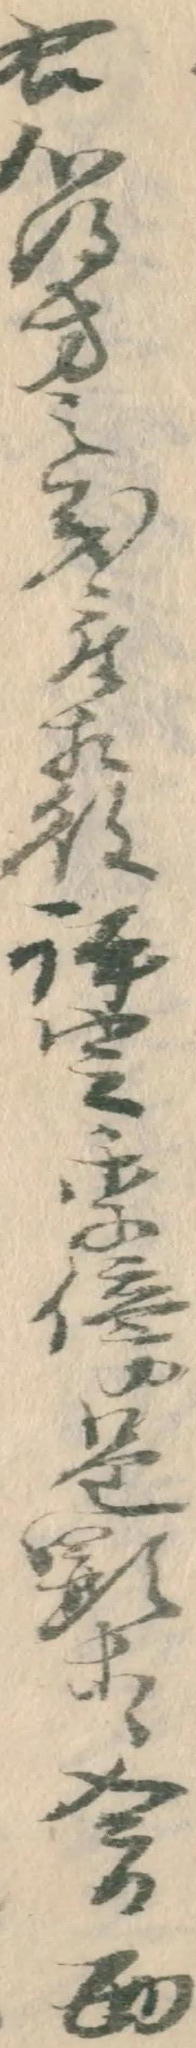右心得方之義ニ付相役評定季傍邑顕等候今日面
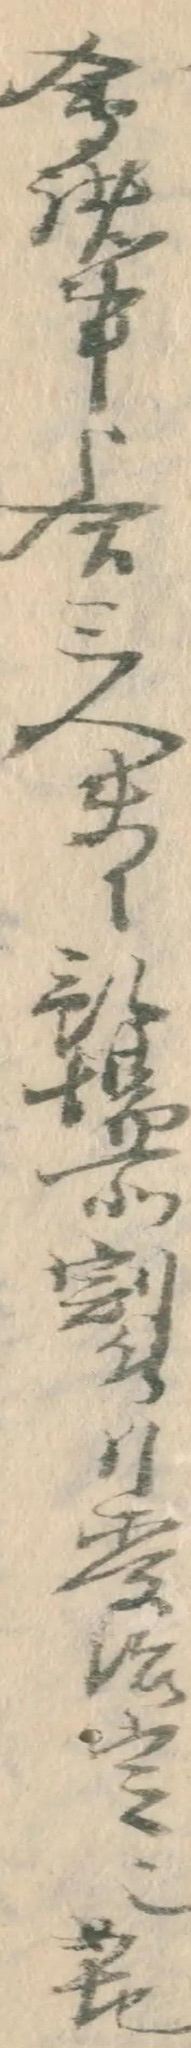會諸事申合三人夫々預場所割付引治定也如左
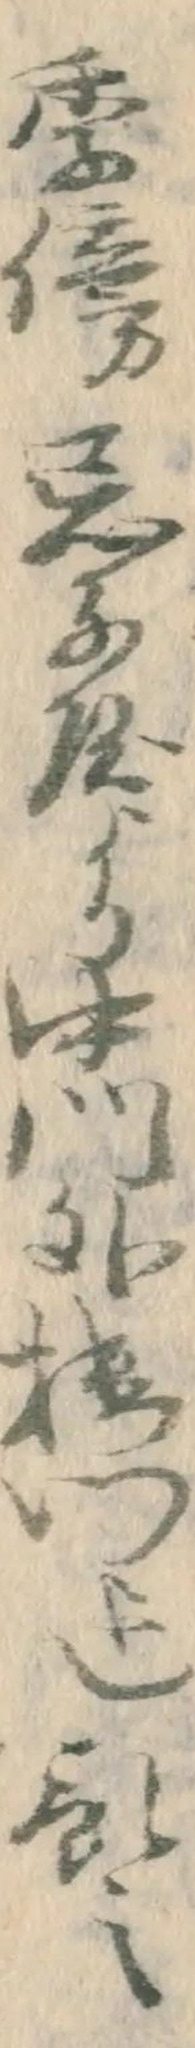季傍忌子屋より中門外楼門迄預之
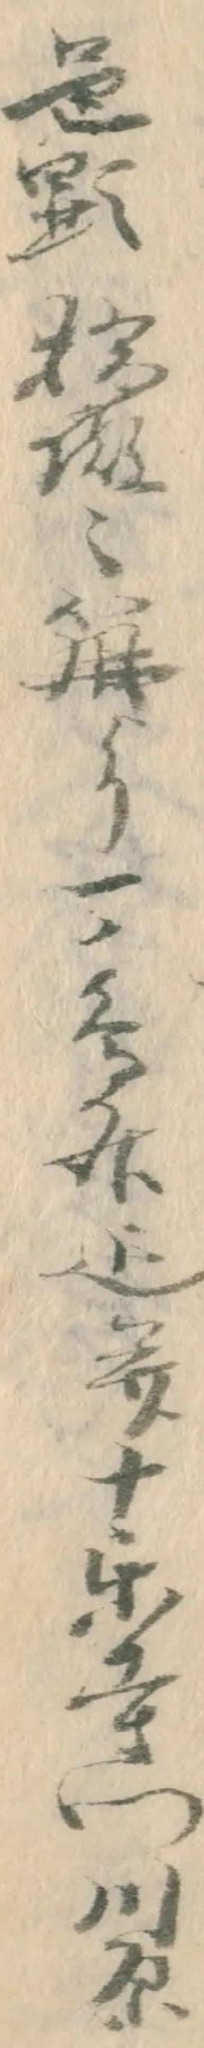邑顕橋殿之笧より一ノ鳥居迄并十楽寺門川原

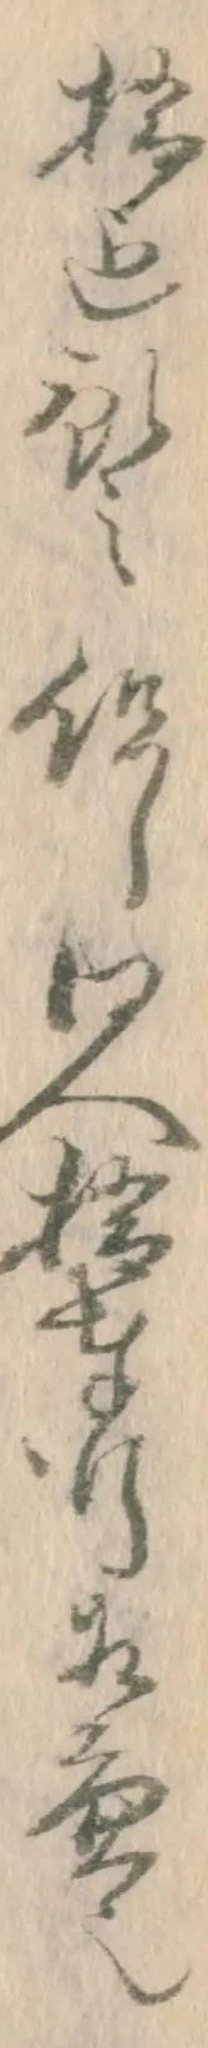橋迄預也但し同人橋奉行相兼也
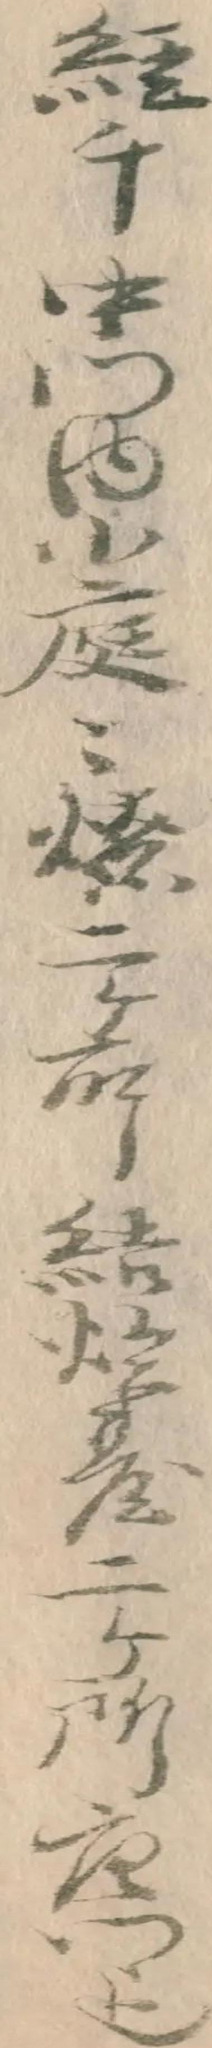経千中門内小庭々燎二ケ所結燈屋二ヶ所唐門迄
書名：賀茂社記録. 第67冊
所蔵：国立国会図書館 National Diet Library, JAPAN
